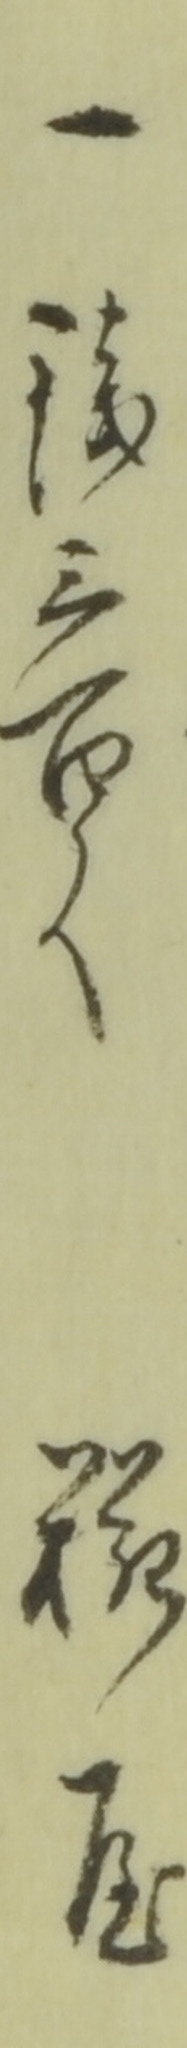一銭三百文麹屋

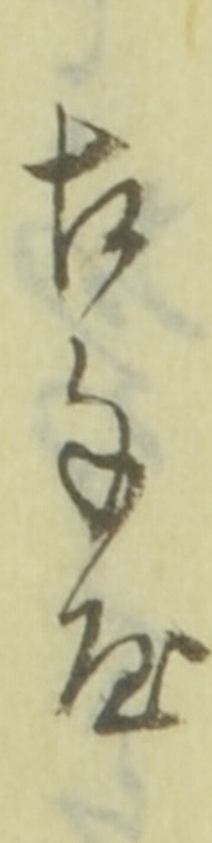古手屋
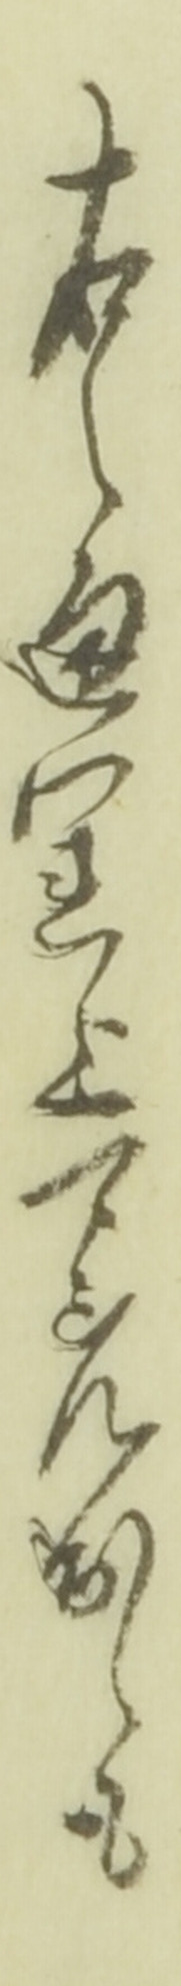右之通運上可差出候以上
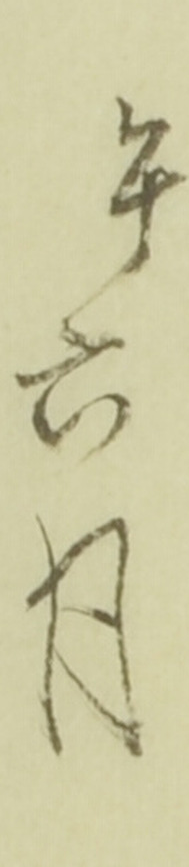午六月
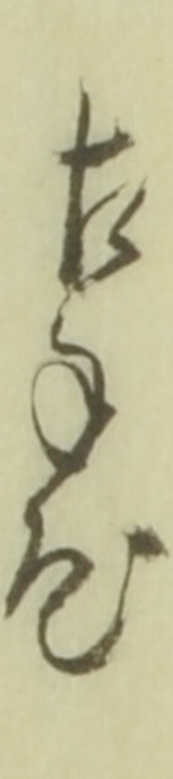古手屋
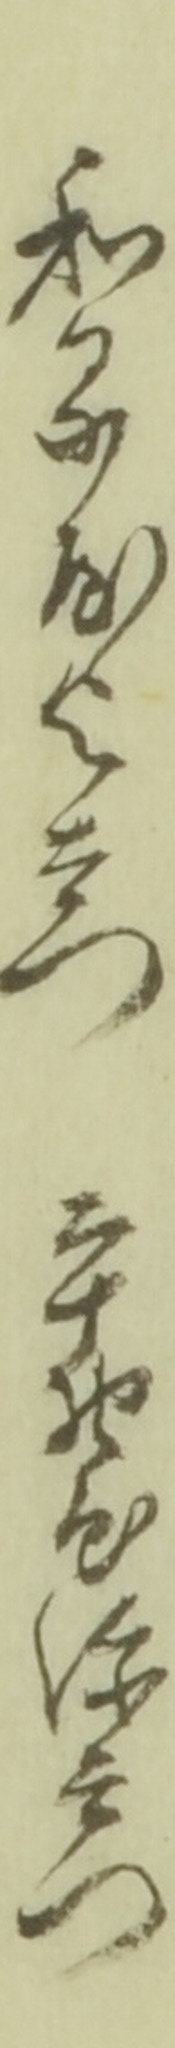和泉屋与右衛門平地屋源右衛門
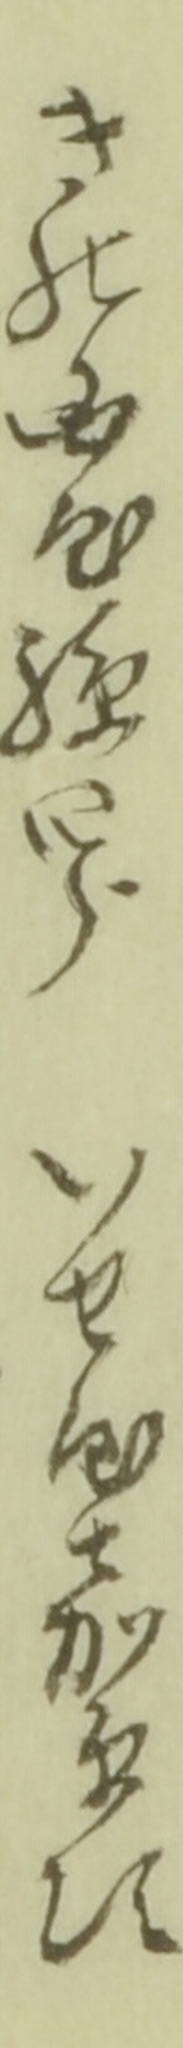き乃国屋源四郎いセ屋加平次
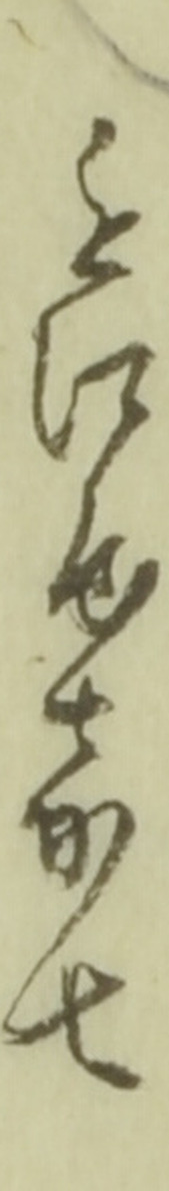近江屋嘉七
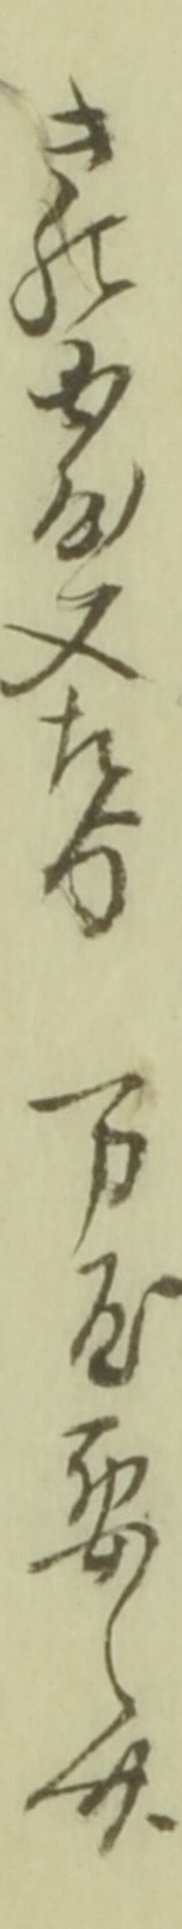き乃国屋又左太郎万屋要之介
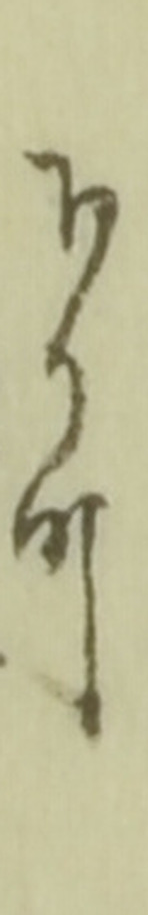下り町
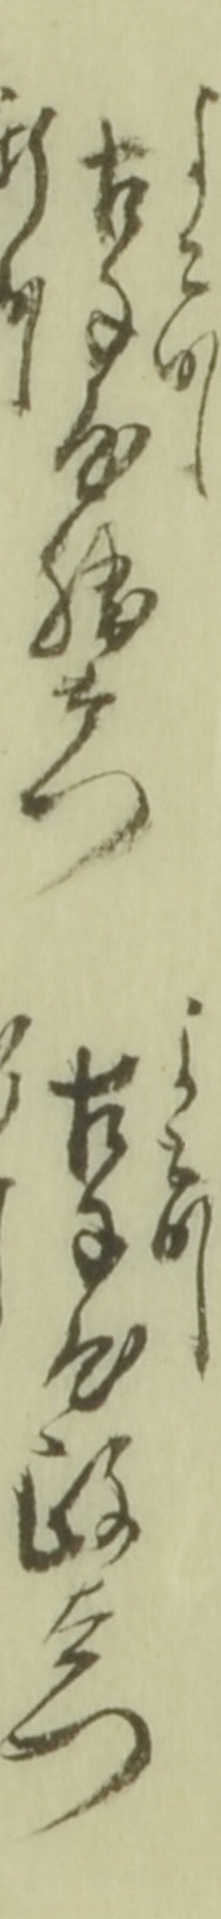古手屋右衛門古手屋政右衛門
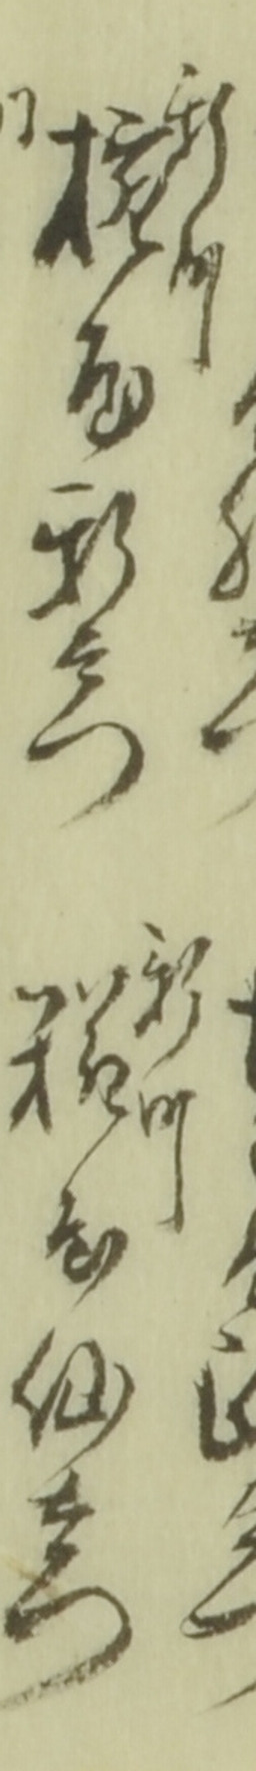椀屋新右衛門糀屋仙右衛門
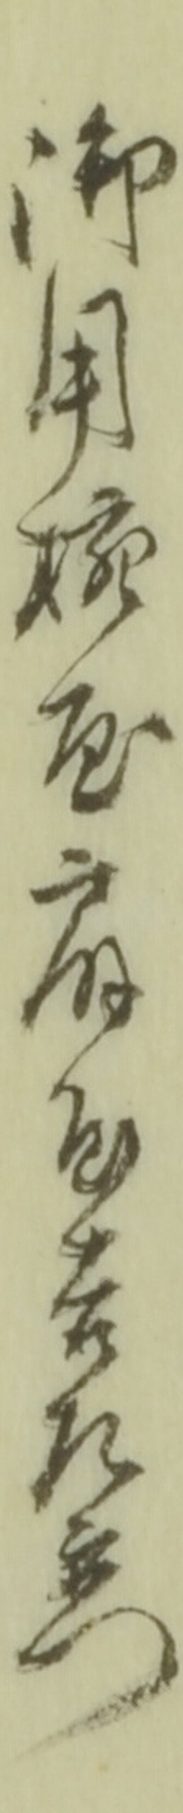御用椀屋扇屋吉左衛門
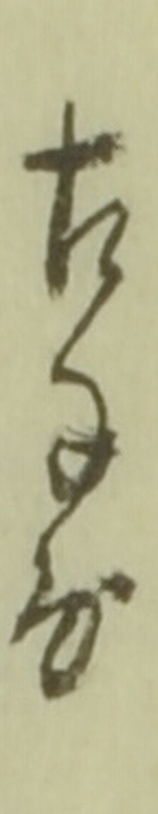古手屋
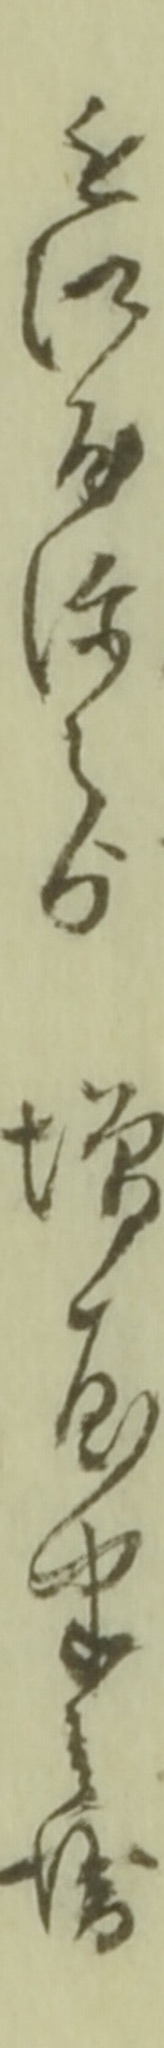近江屋源太郎増屋半兵衛
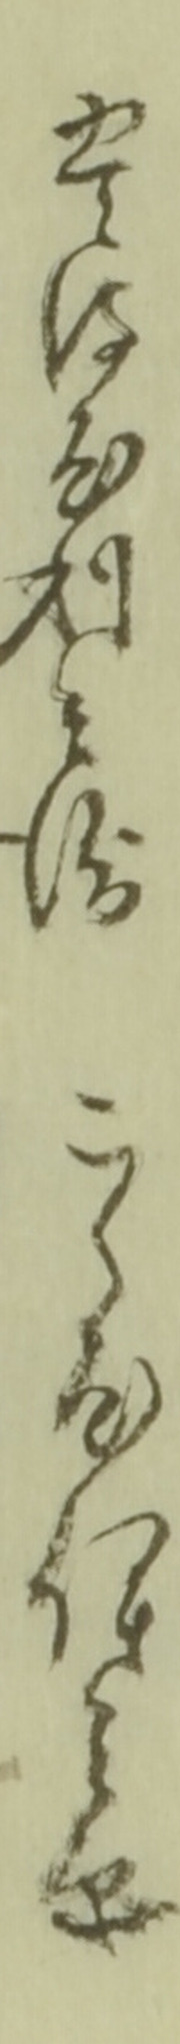宇波屋利兵衛こん屋伊兵衛
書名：御公儀様御領主様御触書控
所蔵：伊那市立高遠町図書館・合同会社AMANE
